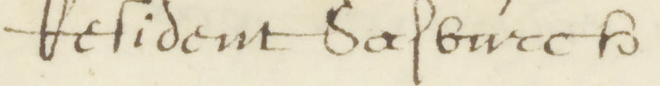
Resident Sasburch
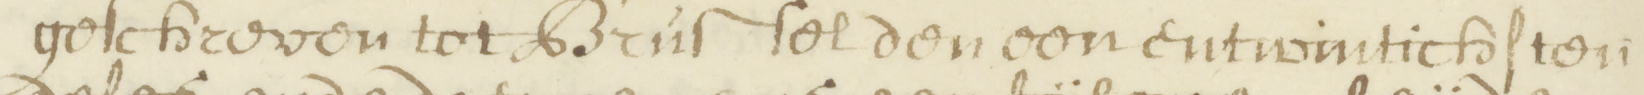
geschreven tot Brussel den eenentwintichsten
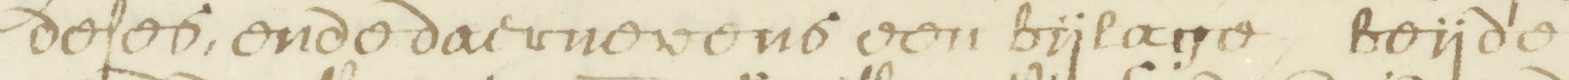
deses, ende daernevens een bijlage, beijde
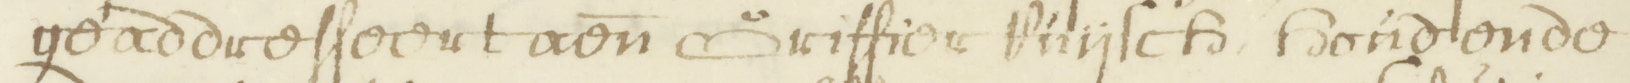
geaddresseert aen Griffier Ruijsch, houdende
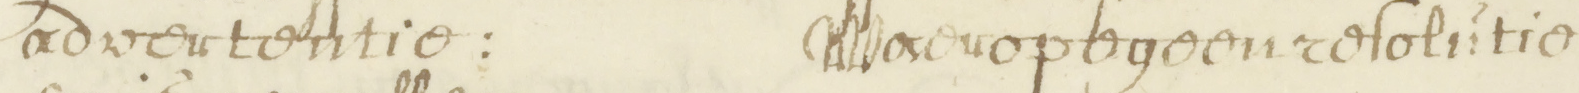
advertentie: Waerop egeen resolutie
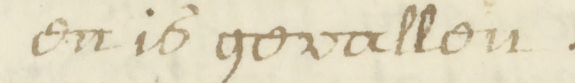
en is gevallen.
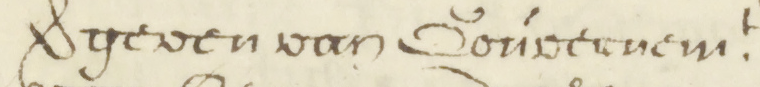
vgeven van Gouvernemt.
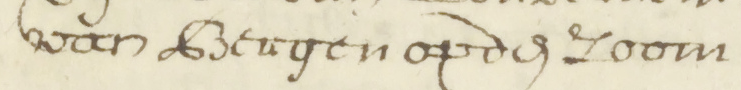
van Bergen opden Zoom
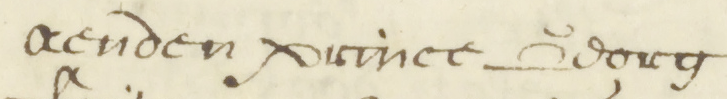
aenden Prince Georg
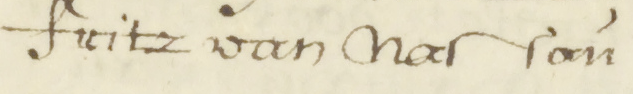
fritz van Nassau
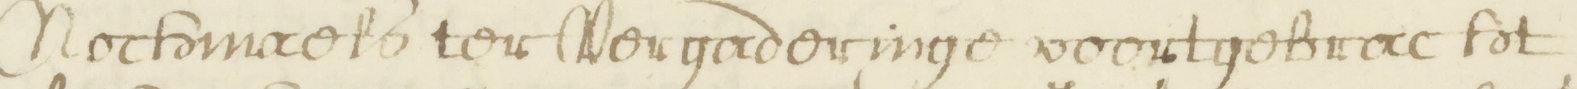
Nochmaels ter Vergaderinge voortgebracht
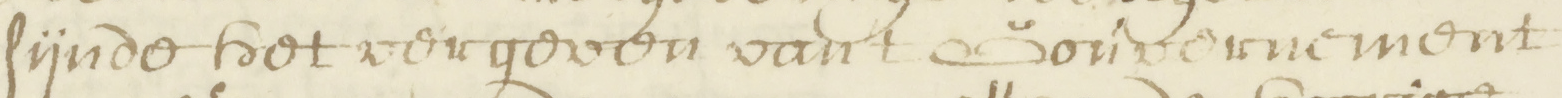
sijnde het vergeven van 't Gouvernement
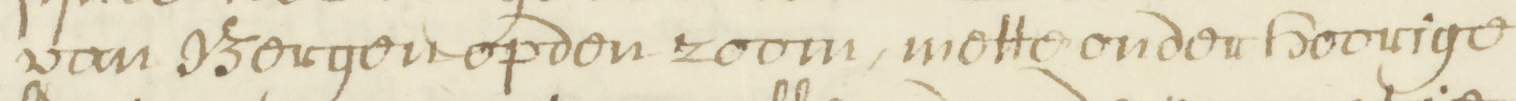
van Bergen opden zoom, mette onderhoorige
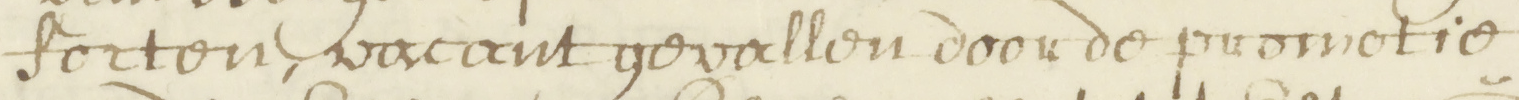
forten, vacant gevallen door de promotie
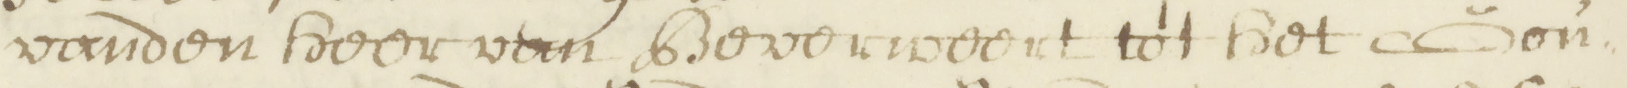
vanden heer van Beverweert tot het Gou„
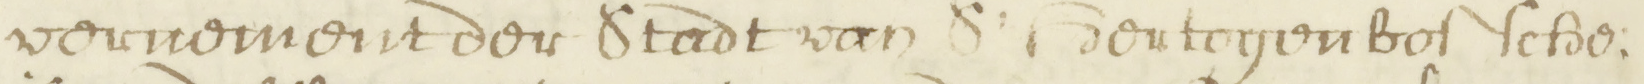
vernement der Stadt van S'Hertogenbossche.
